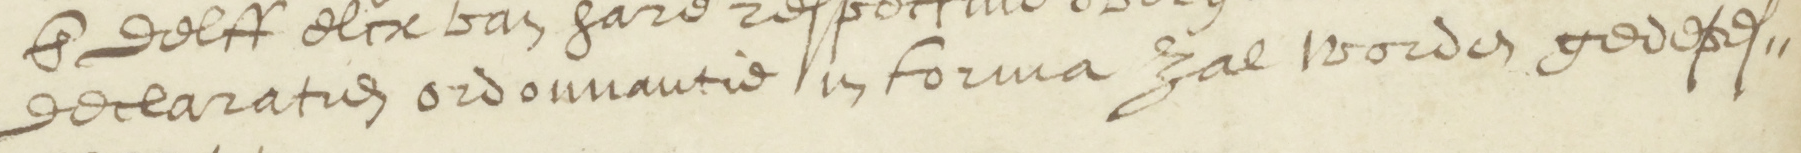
declaratien ordonnantie in forma zal worden gedepes„
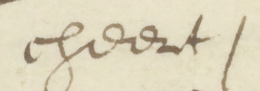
cheert.
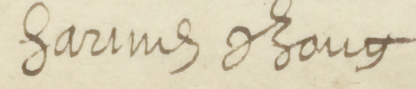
harmen Bong
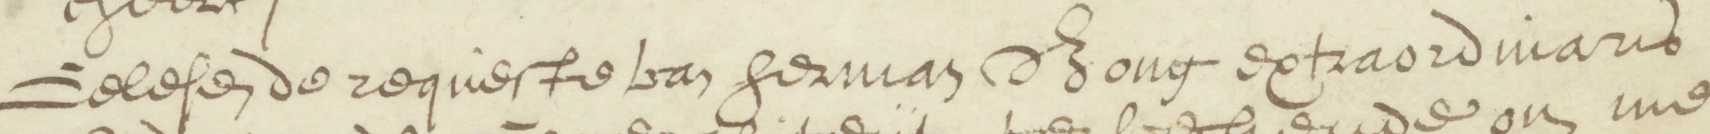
Gelesen de requeste van herman Bong extraordinaris
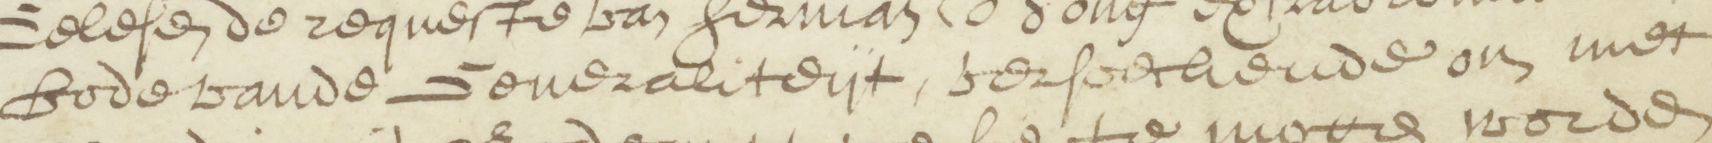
bode vande Generaliteijt, versoeckende om met
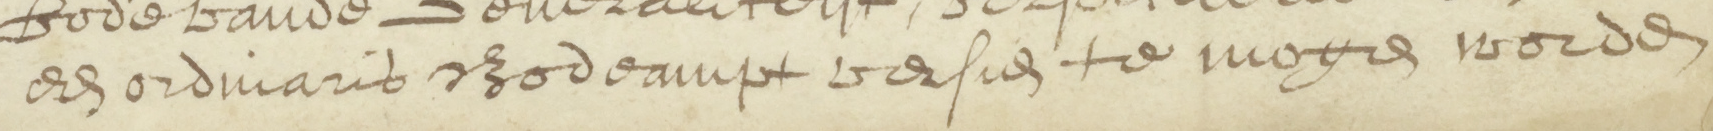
een ordinaris Bodeampt versien te mogen worden
